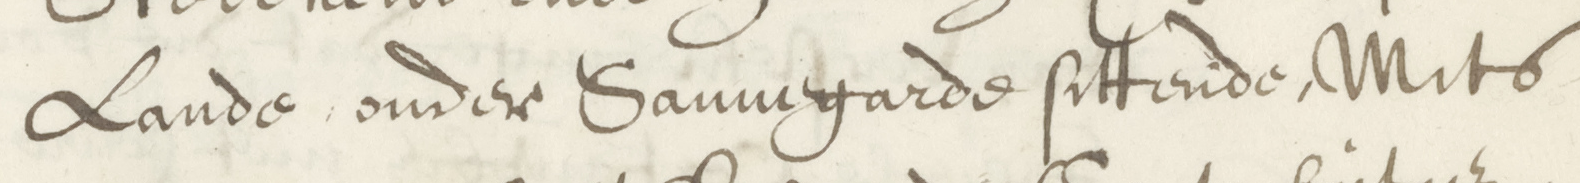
Lande, onder Sauuegarde sittende, Mits
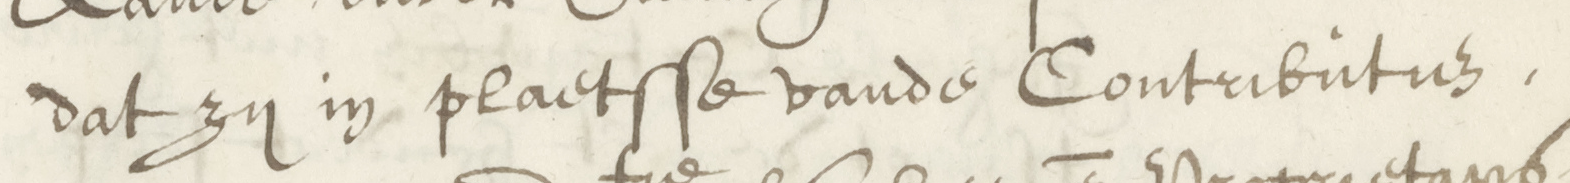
dat zij in plaetsse vande Contributien,
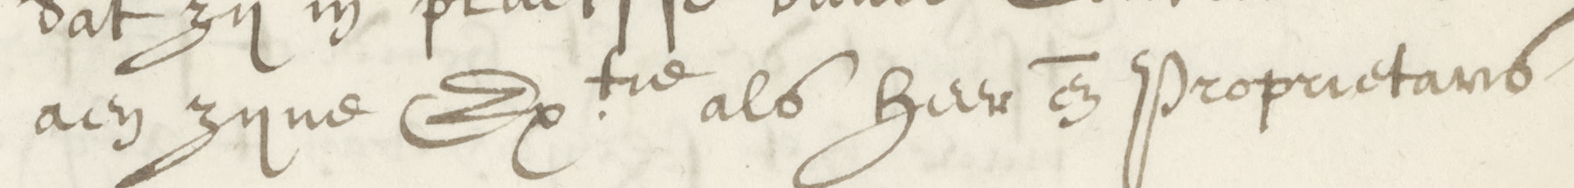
aen zyne Extie als heer en Proprietaris
